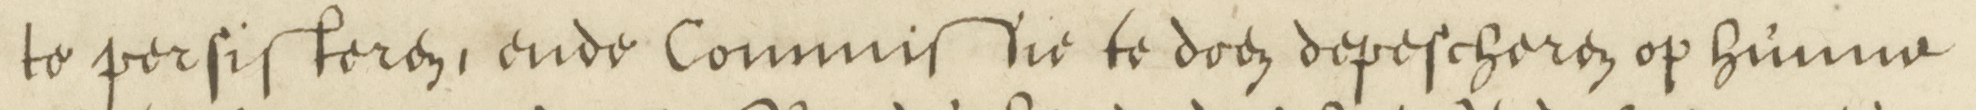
te persisteren, ende commissie te doen depescheren op hunne
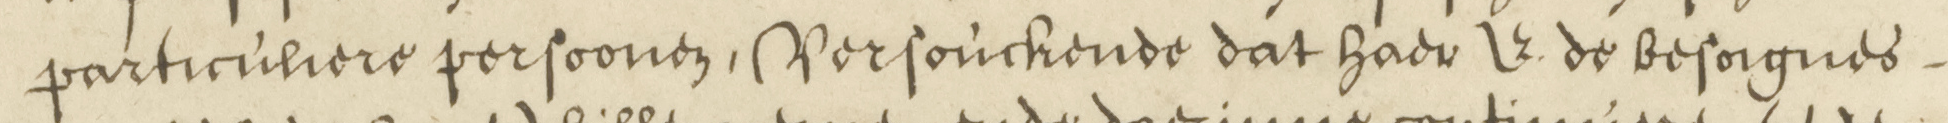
particuliere persoonen. Versouckende dat haer E. de besoignes
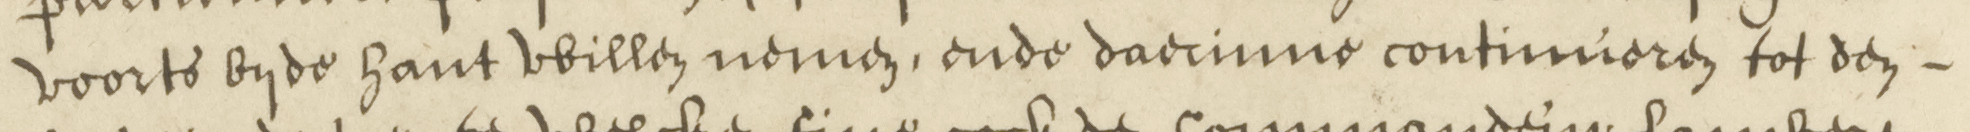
voorts byde hant willen nemen, ende daerinne continueren tot den
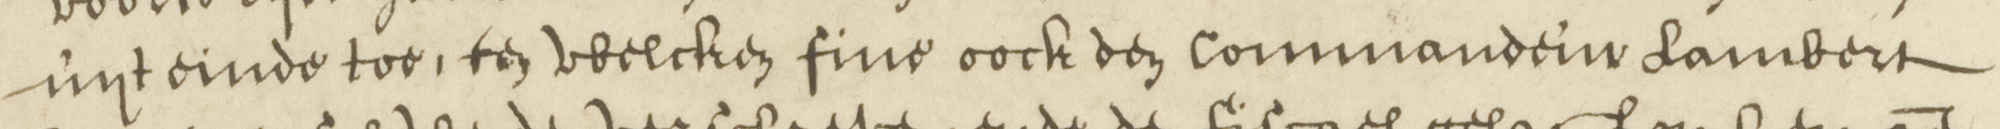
uyt einde toe, ten welcken fine oock den commandeur Lambert
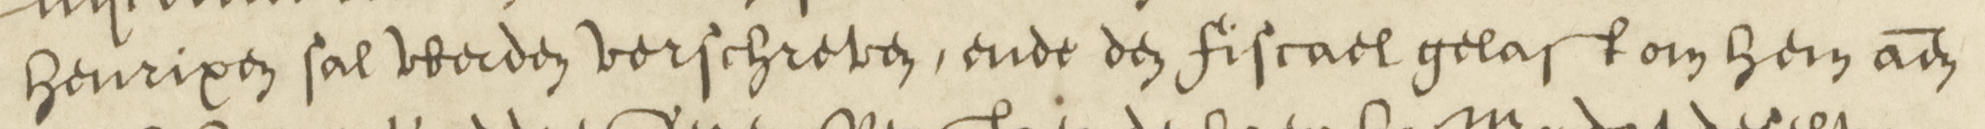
Henrixen sal werden verschreven, ende den fiscael gelast om hem aen
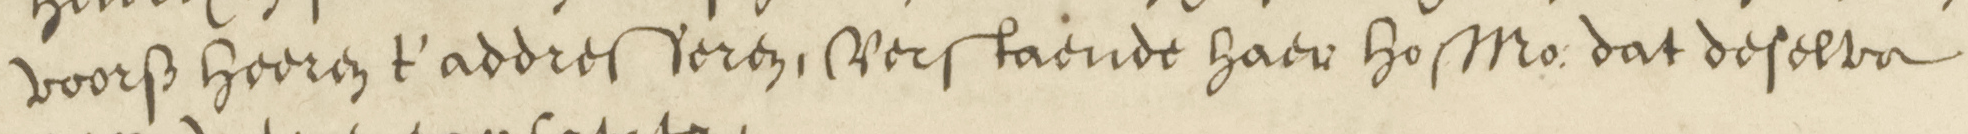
voors heeren t'addresseren, verstaende haer Ho:Mo: dat deselve
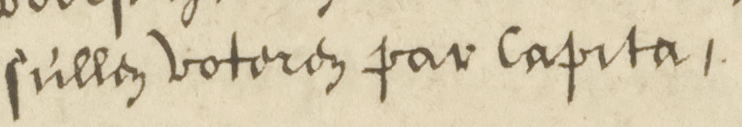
sullen voteren par capita.
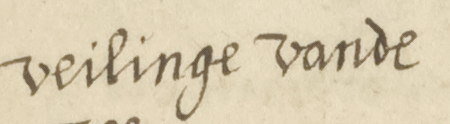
veilinge vande
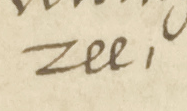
zee.
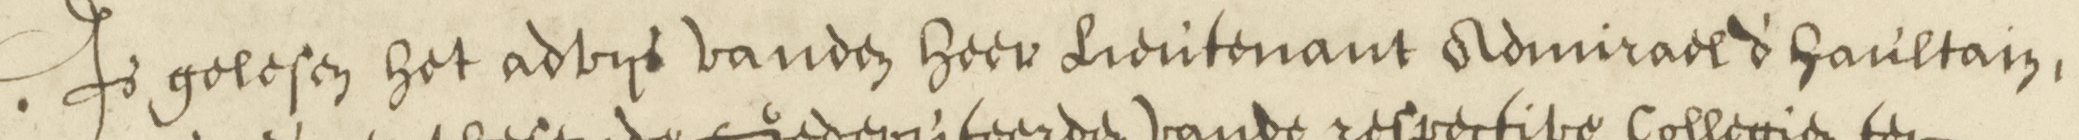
Is gelesen het advys vanden heer Lieutenant Admirael d'haultain,
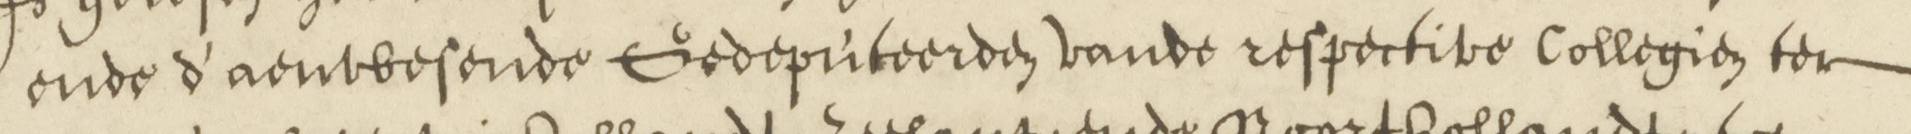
ende d'aenwesende Gedeputeerden vande respective Collegien ter
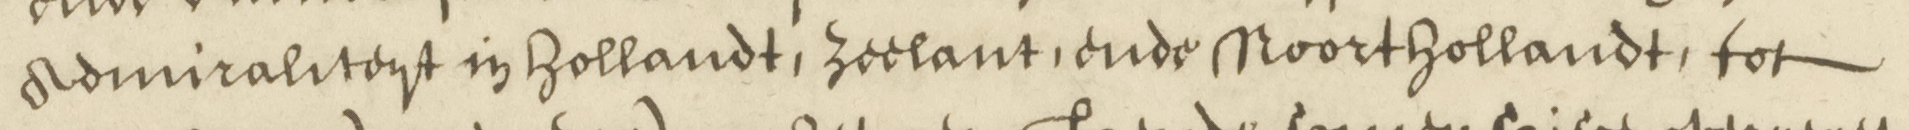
Admiraliteyt in Hollandt, Zeelant ende Noorthollandt, tot
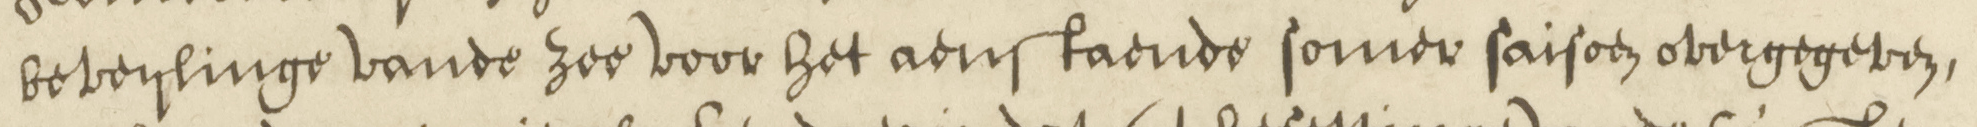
beveylinge vande zee voor het aenstaende somer saison overgegeven,
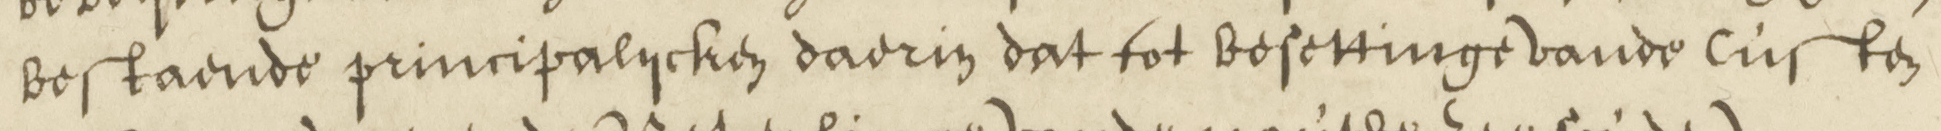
bestaende principalycken daerin dat tot besettinge vande custen
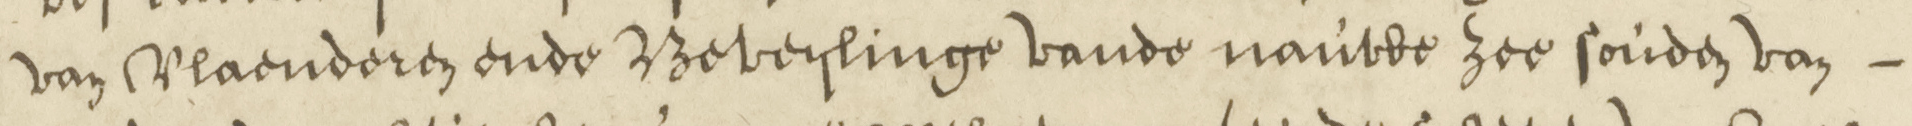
van Vlaenderen ende Beveylinge vande nauwe zee souden van -
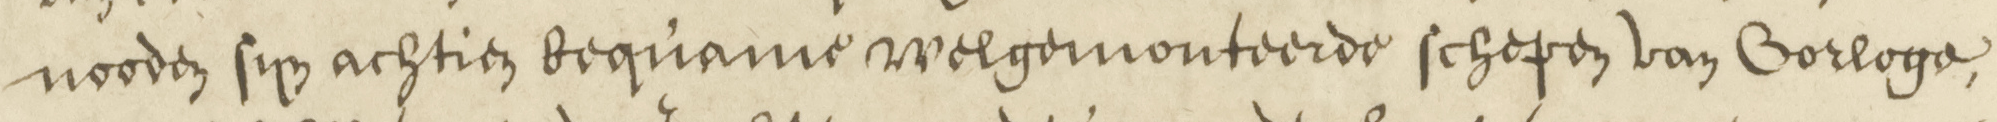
nooden syn achtien bequame welgemonteerde schepen van Oorloge
